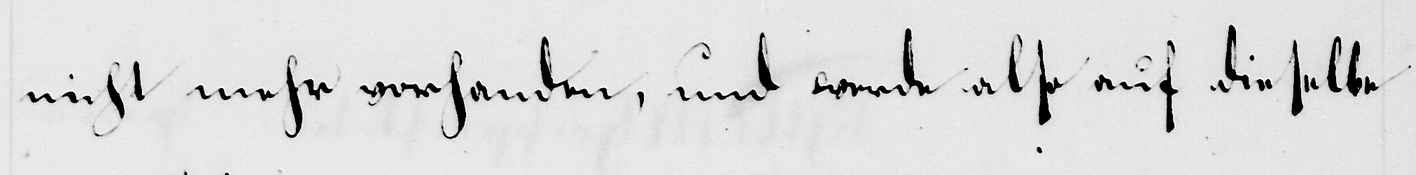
nicht mehr vorhanden, und werde also auf dieselbe
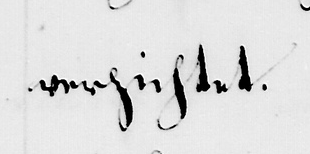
verzichtet.
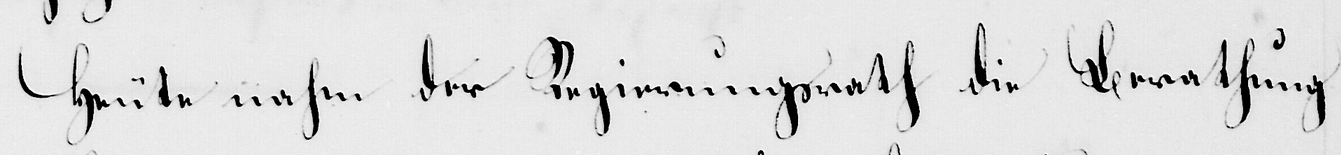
Heute nahm der Regierungsrath die Berathung
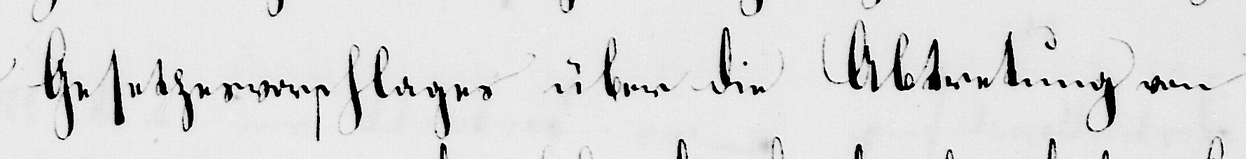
Gesetzesvorschlages über die Abtretung von
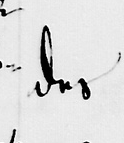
des
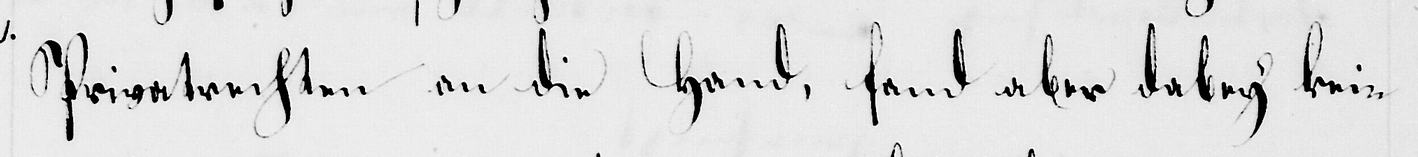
Privatrechten an die Hand, fand aber dabey kein¬
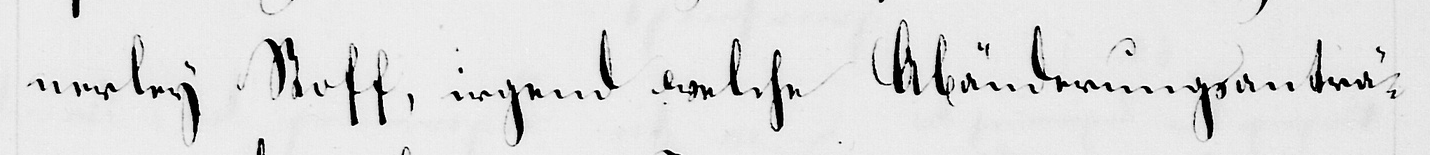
erley Stoff, irgend welche Abänderungsanträ¬
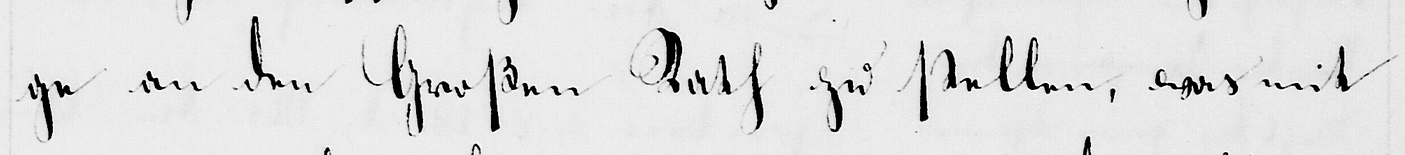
ge an den Großen Rath zu stellen, was mit
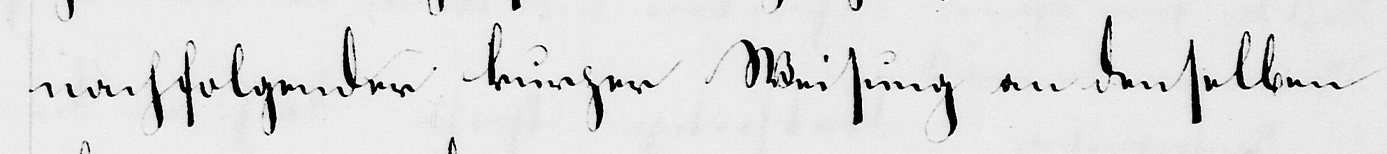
nachfolgender kurzer Weisung an denselben
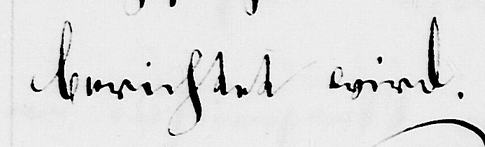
berichtet wird.
